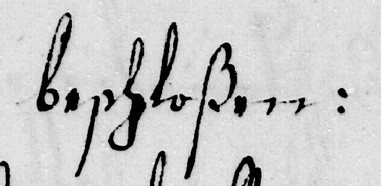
beschloßen:
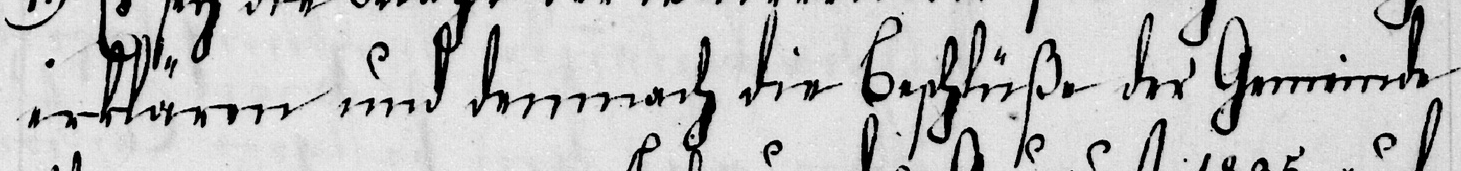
erklären und demnach die Beschlüße der Gemeinde
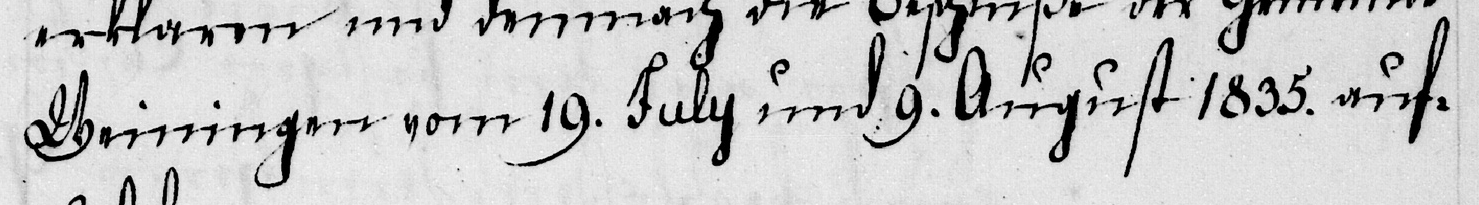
Weiningen vom 19. July und 9. August 1835. auf¬
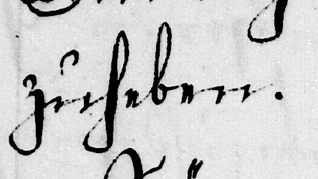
zuheben.
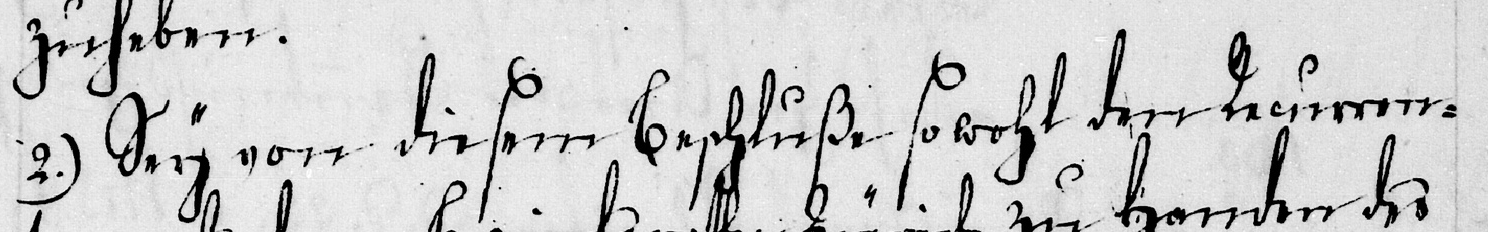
2.) Sey von diesem Beschluße sowohl den Recurren¬
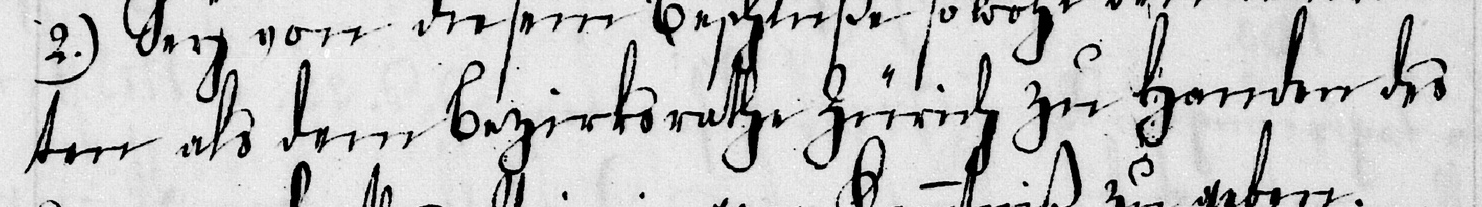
ten als dem Bezirksrathe Zürich zu Handen des
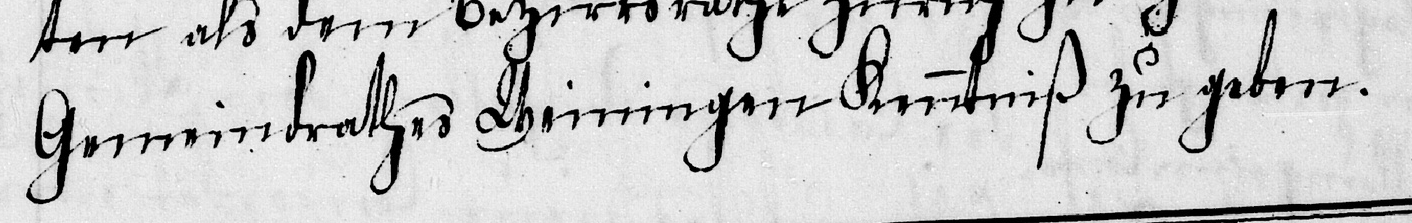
Gemeindrathes Weiningen Kenntniß zu geben.
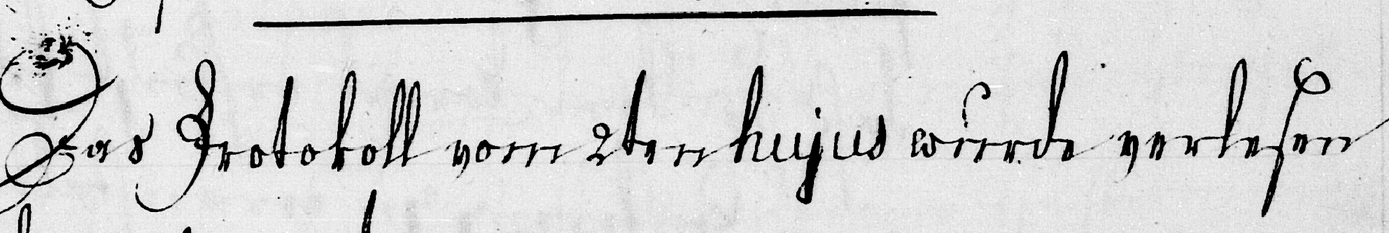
Das Protokoll vom 2ten hujus wurde verlesen
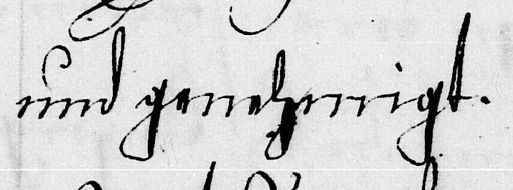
und genehmigt.
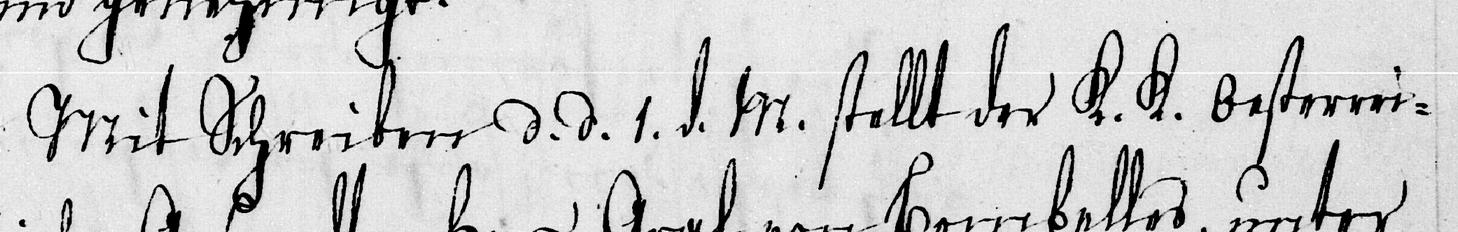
Mit Schreiben d. d. 1. d. M. stellt der K. K. oesterrei¬
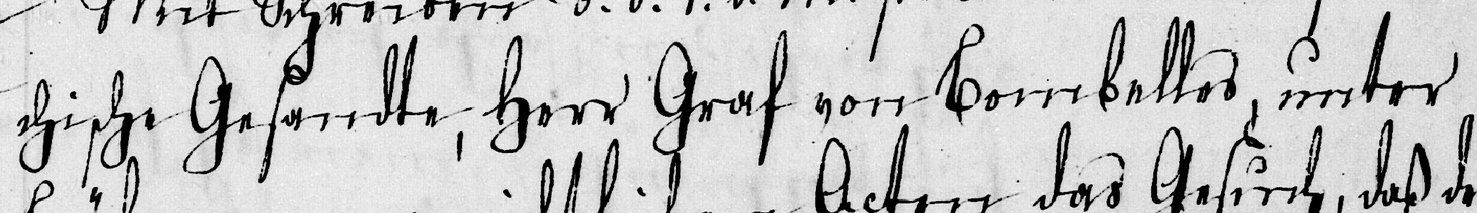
chische Gesandte, Herr Graf von Bombelles, unter
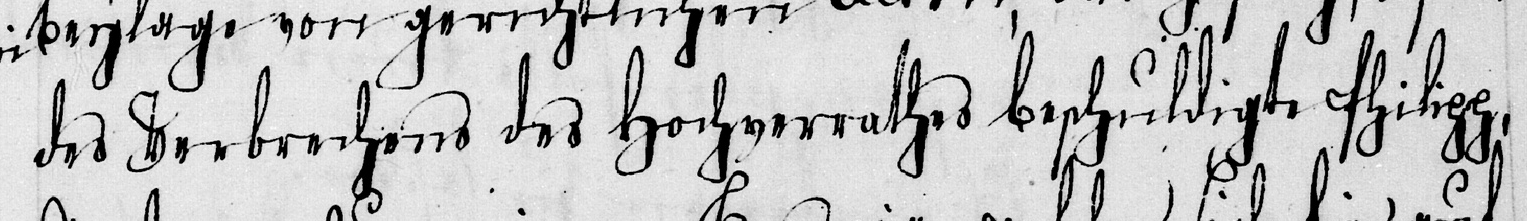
des Verbrechens des Hochverrathes beschuldigte Philip¬
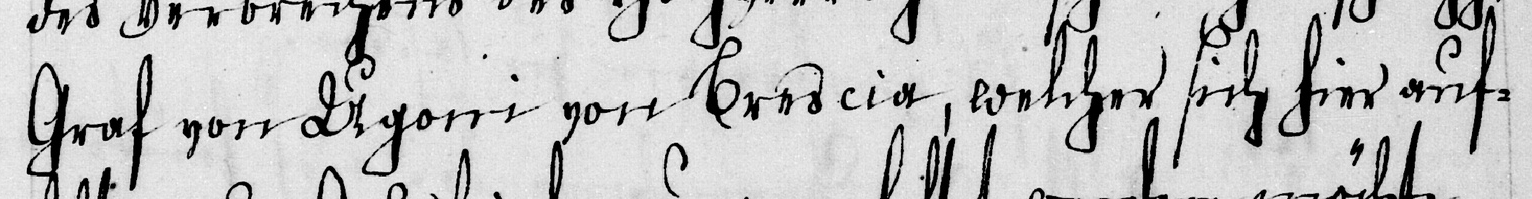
Graf von Ugoni von Brescia, welcher sich hier auf¬
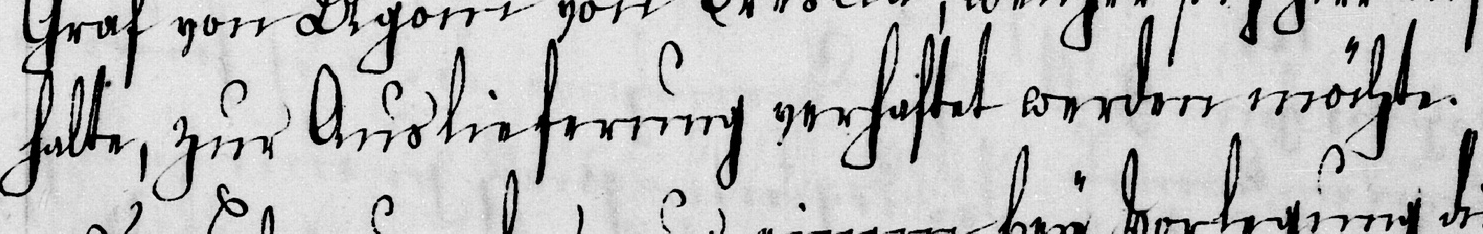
halte, zur Auslieferung verhaftet werden möchte.
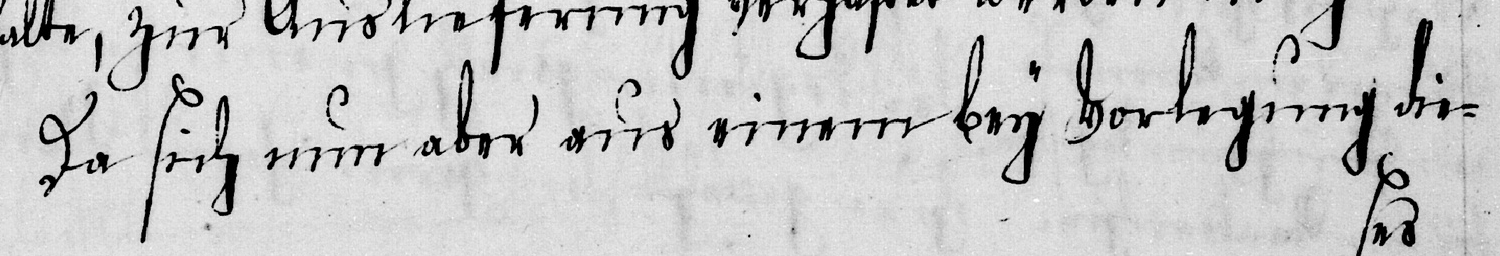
Da sich nun aber aus einem bey Vorlegung die-
